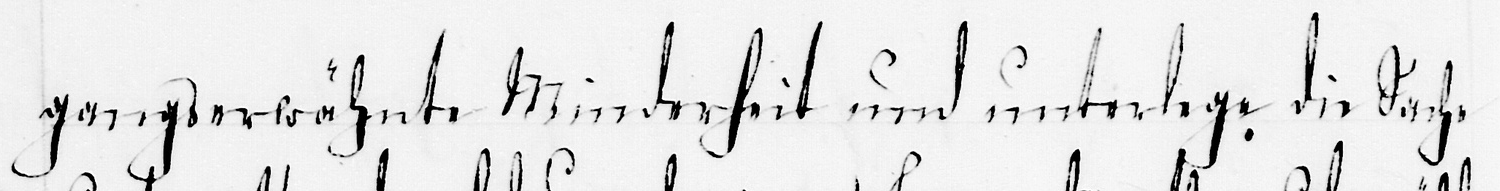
gangserwähnte Minderheit und unterlege die Sache
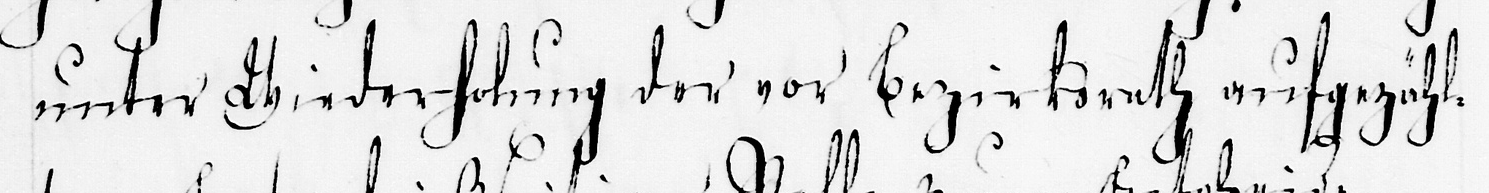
unter Wiederholung der vor Bezirksrath aufgezähl¬
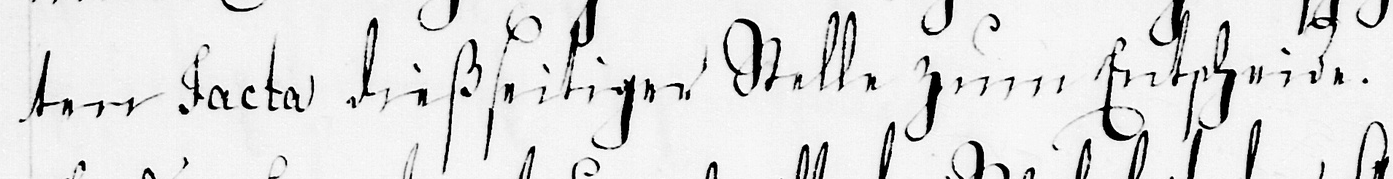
ten Facta dießseitiger Stelle zum Entscheide.
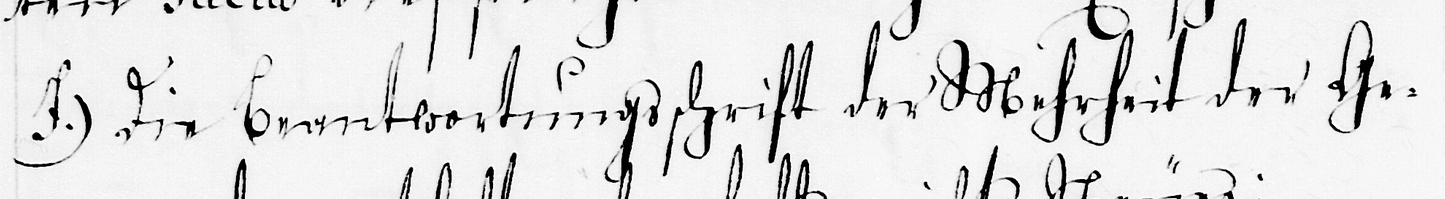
I.) Die Beantwortungsschrift der Mehrheit der Ge¬
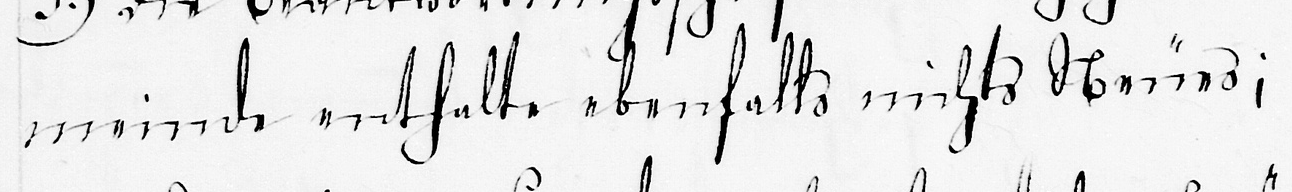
meinde enthalte ebenfalls nichts Neues;
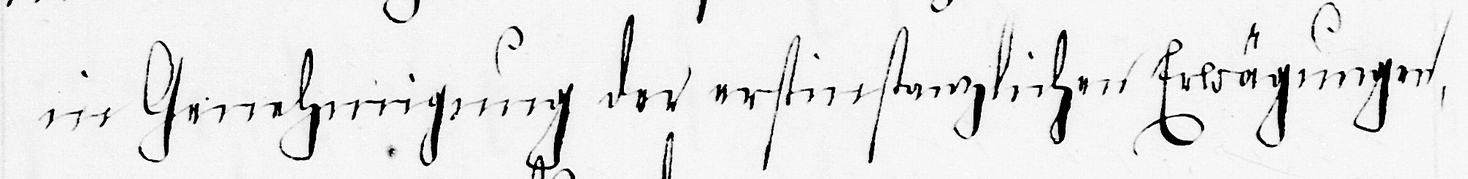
in Genehmigung der erstinstanzlichen Erwägungen,
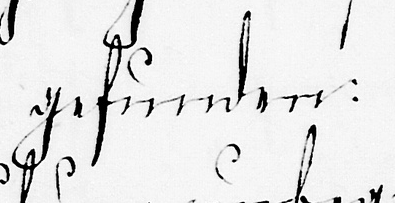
gefunden:
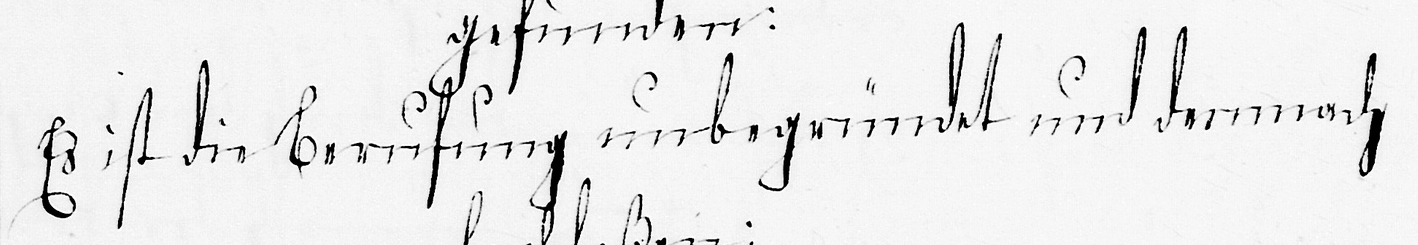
Es ist die Berufung unbegründet und demnach
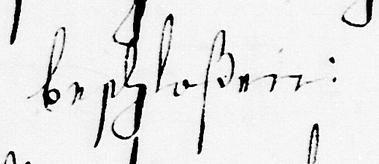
beschloßen:
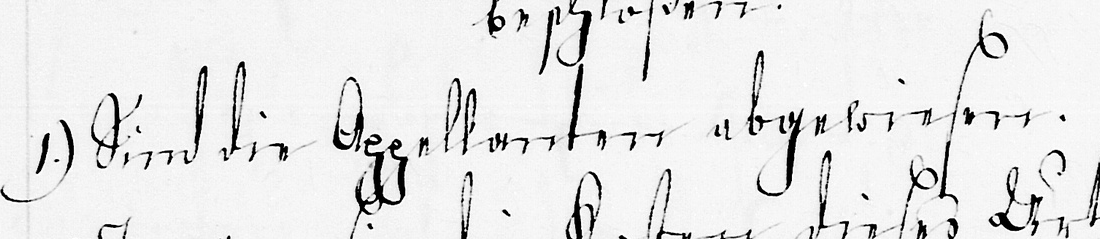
1.) Sind die Appellanten abgewiesen.
